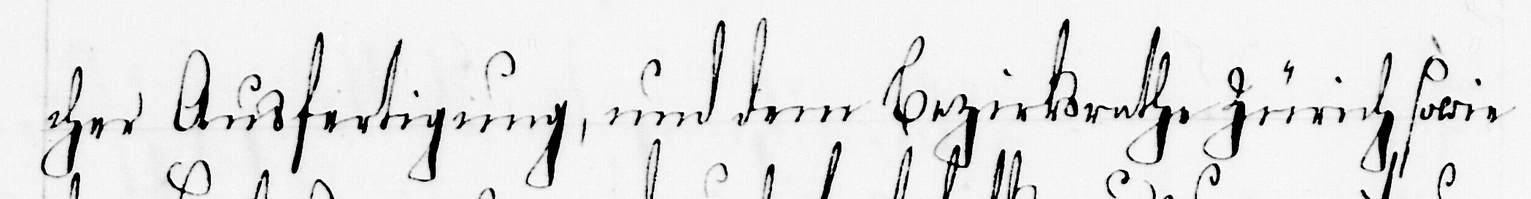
cher Ausfertigung, und dem Bezirksrathe Zürich sowie
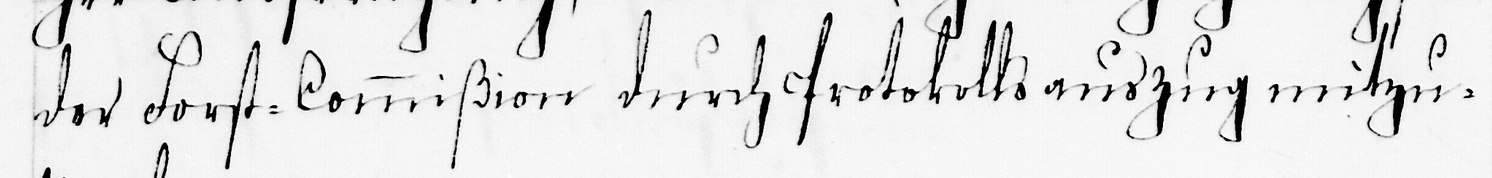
der Forst-Commißion durch Protokollsauszug mitzu¬
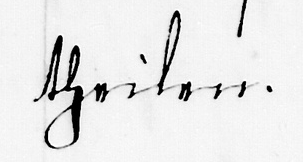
theilen.
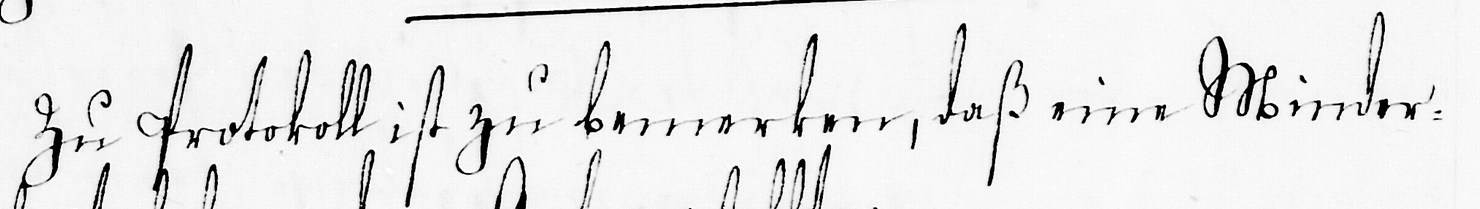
Zu Protokoll ist zu bemerken, daß eine Minder¬
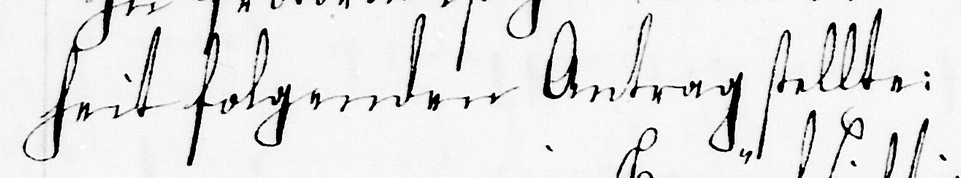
heit folgenden Antrag stellte:
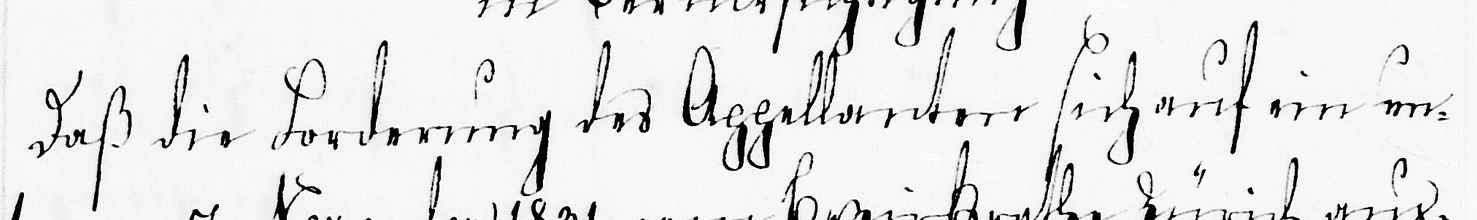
Daß die Forderung des Appellanten sich auf ein un¬
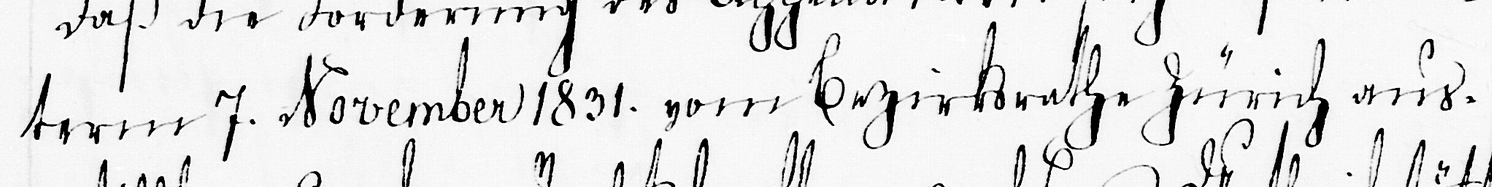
term 7. November 1831. vom Bezirksrathe Zürich aus¬
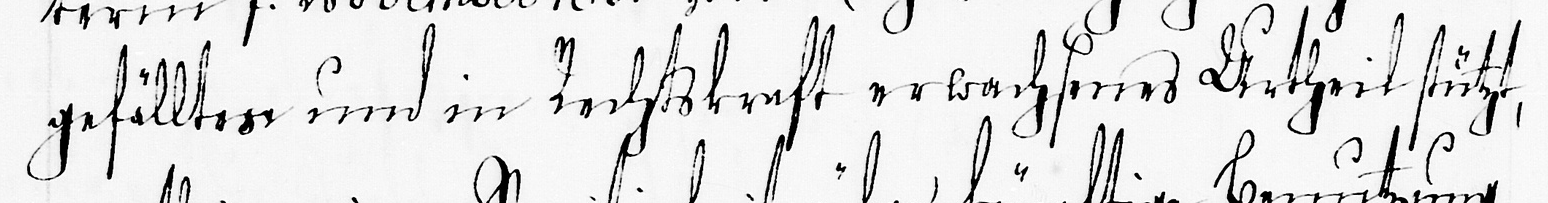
gefällten und in Rechtskraft erwachsenes Urtheil stüt¬
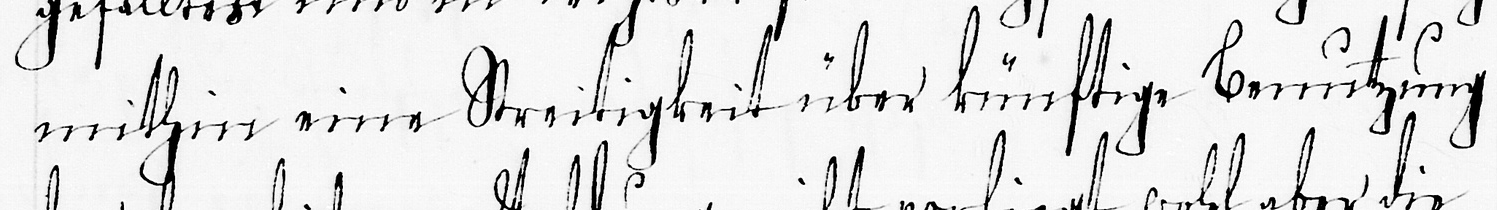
mithin eine Streitigkeit über künftige Benutzung
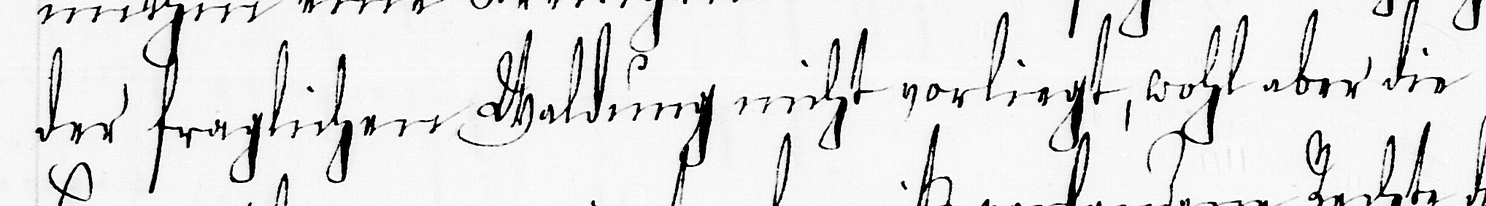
der fraglichen Waldung nicht vorliegt, wohl aber die
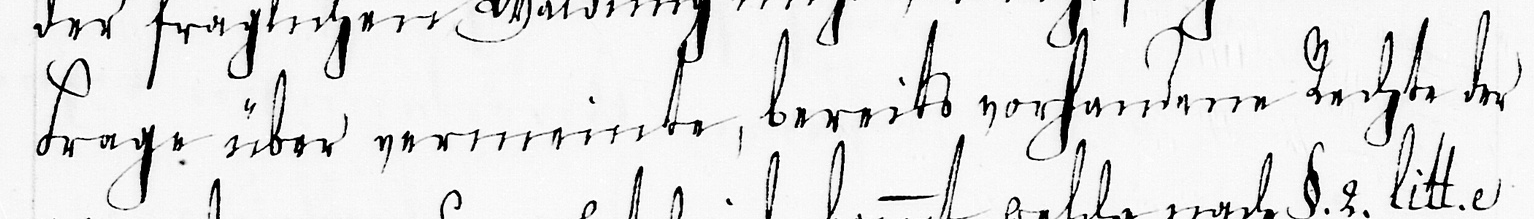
Frage über vermeinte, bereits vorhandene Rechte der
